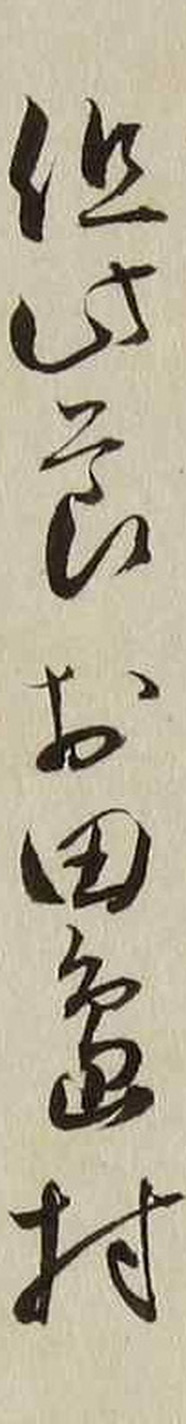但此節於田辺村
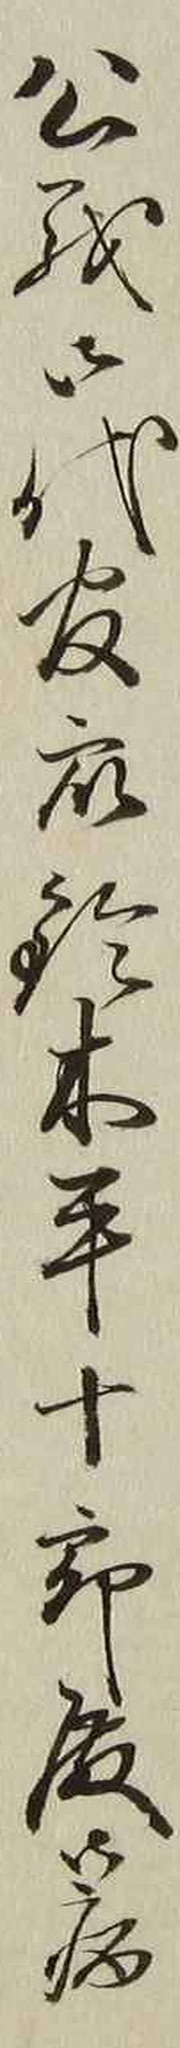公義御代官衆鈴木平十郎殿御病
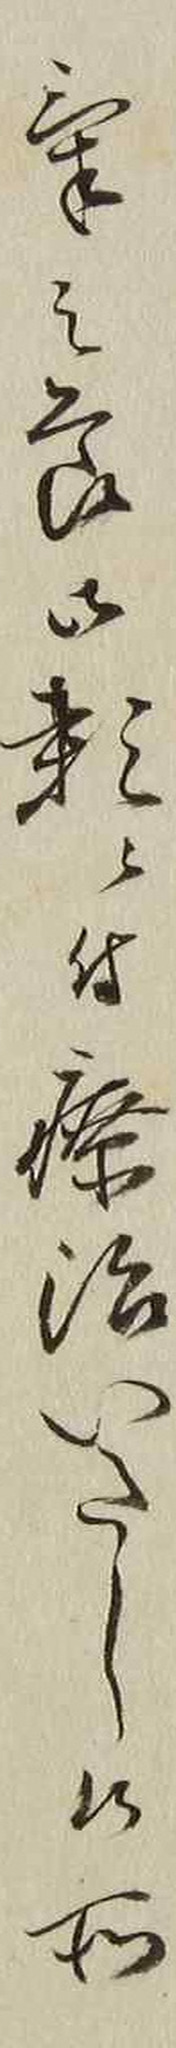気之節御頼に付療治いたし候所
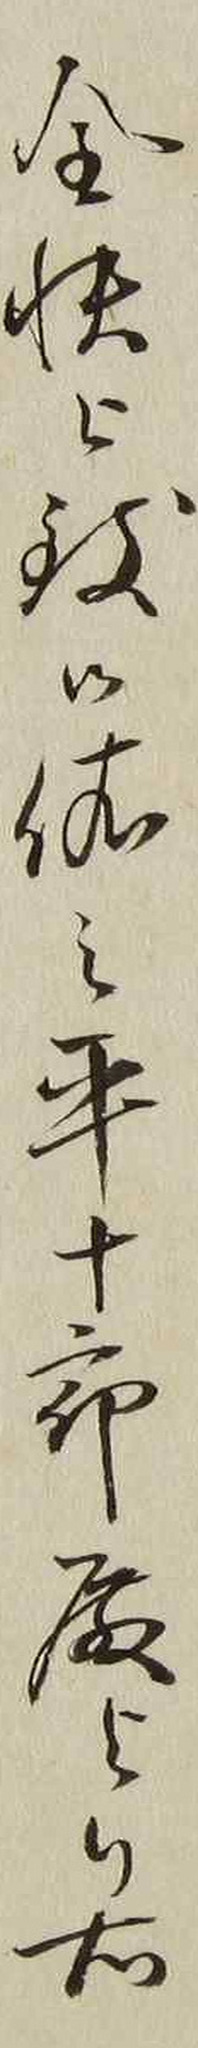全快被致候依之平十郎殿より右
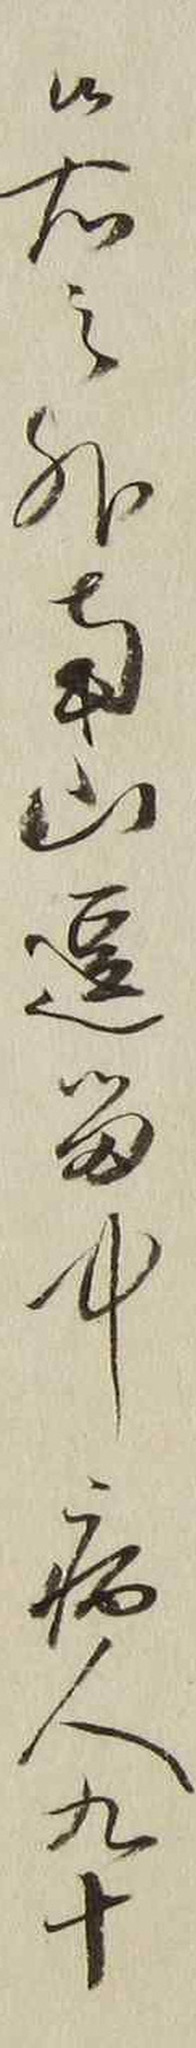候右之外南山逗留中病人九十
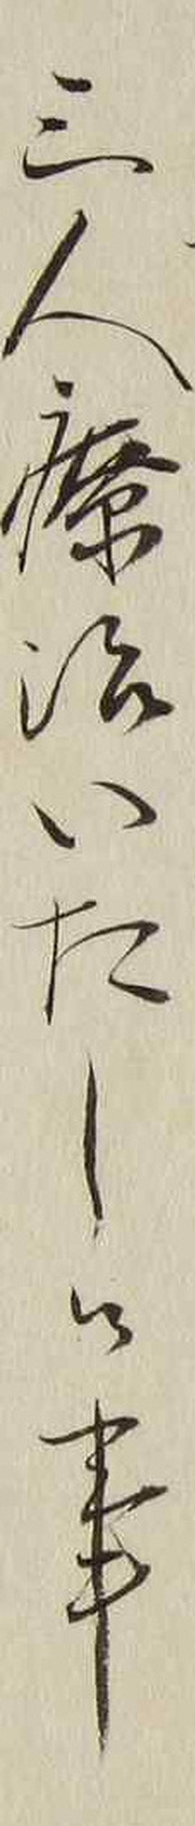三人療治いたし候事
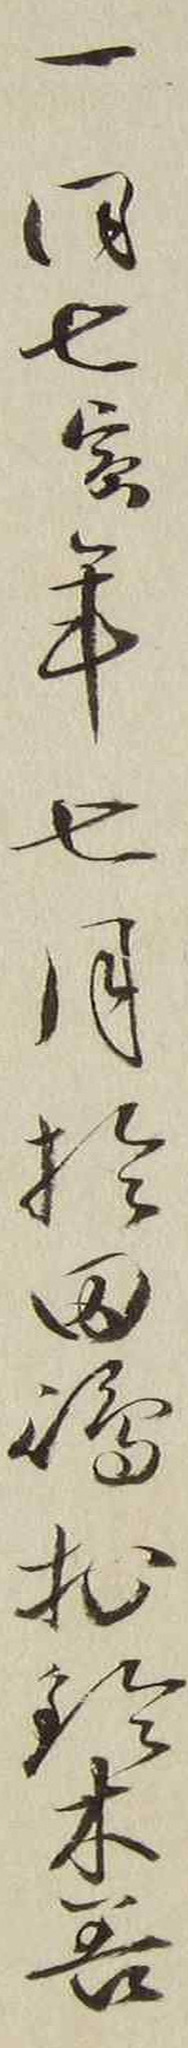一同七寅年七月於田嶋村鈴木善
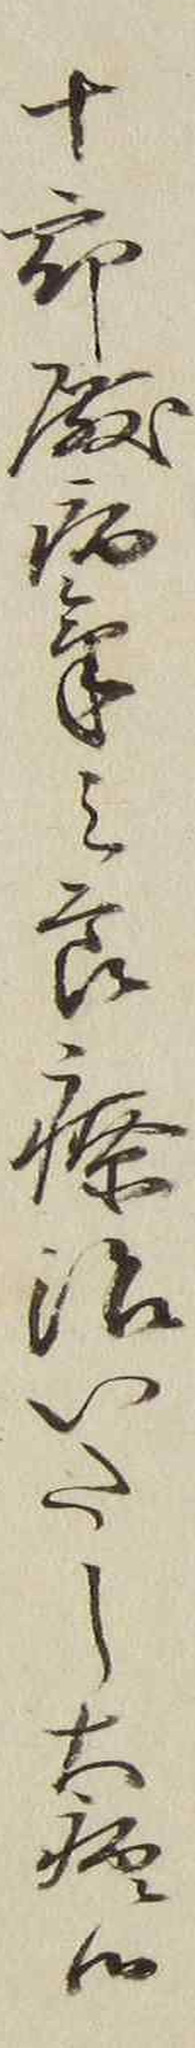十郎殿病気之節療治いたし大病に候

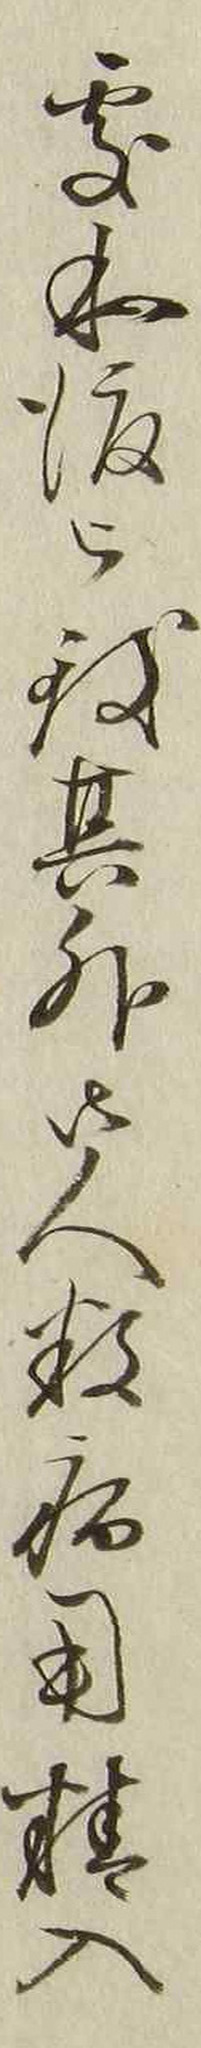処本復被致其外御人数病用精入
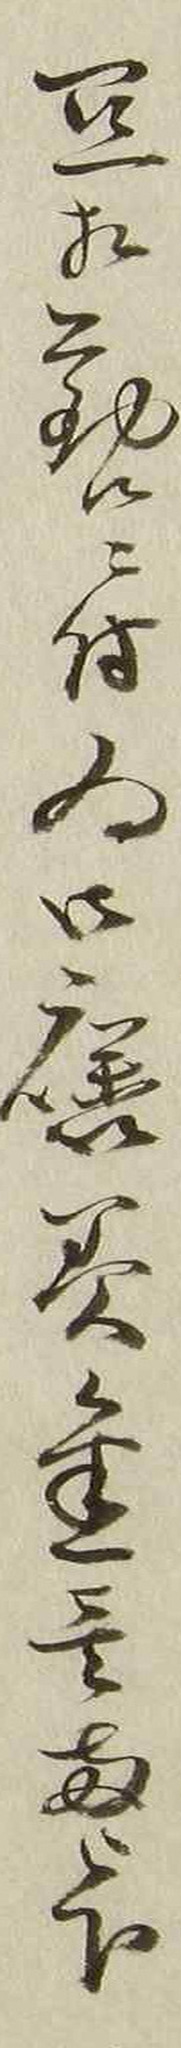宜相勤候に付為御褒美金壱両被下
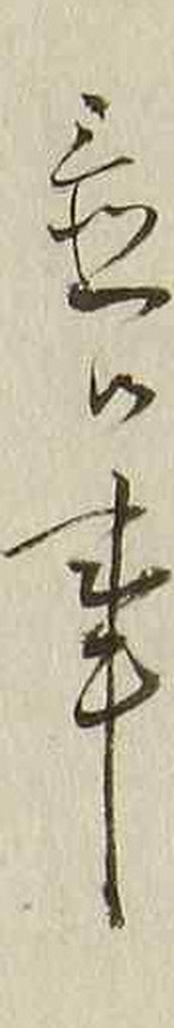置候事
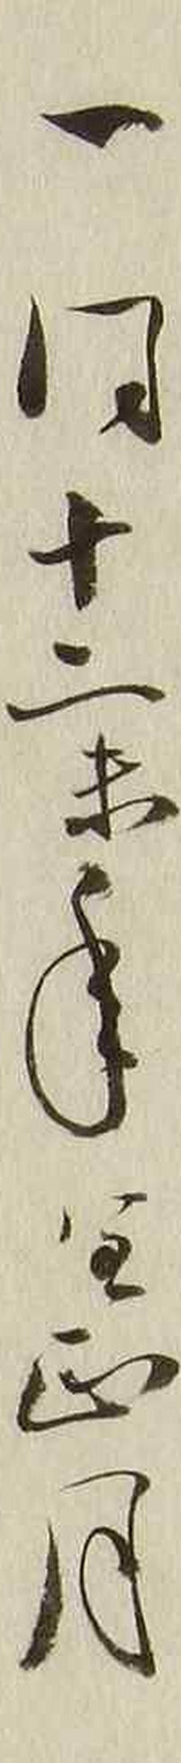一同十二未年閏正月
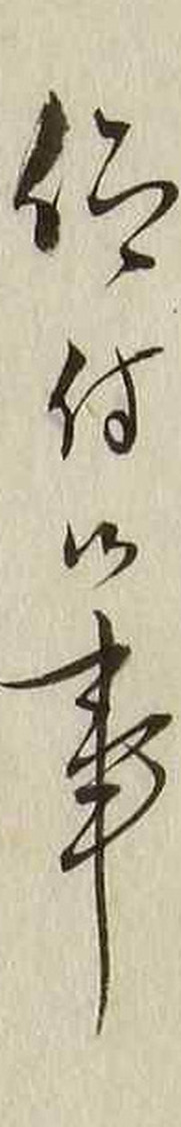仰付候事
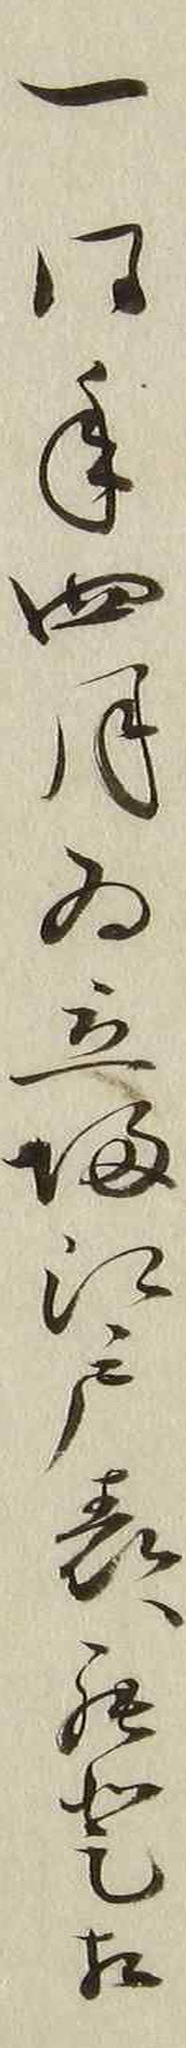一同年四月為立帰江戸表へ罷登相
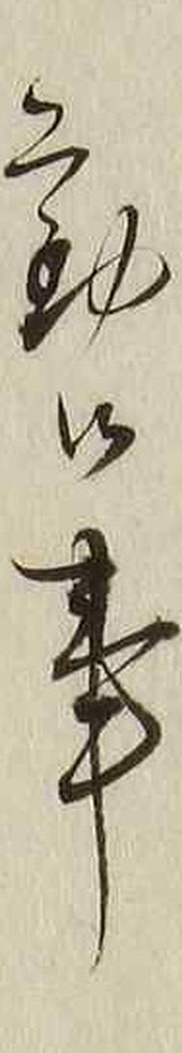勤候事
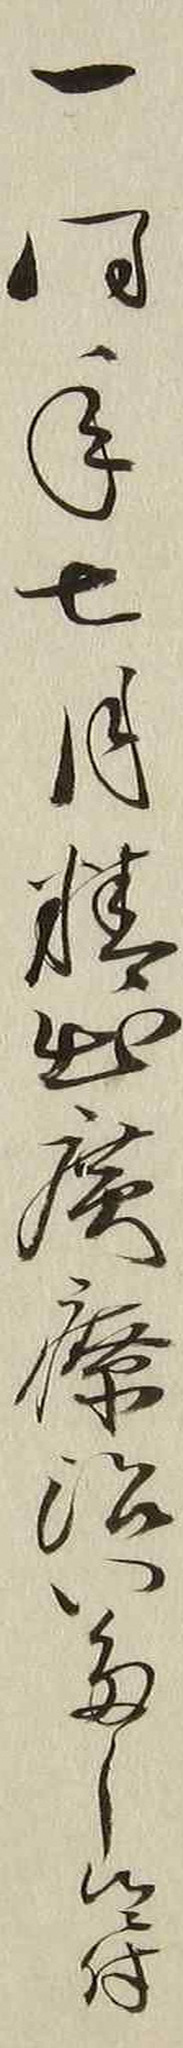一同年七月精出広療治いたし候に付
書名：諸士系譜　巻之157　ね之部1
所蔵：会津若松市立会津図書館
